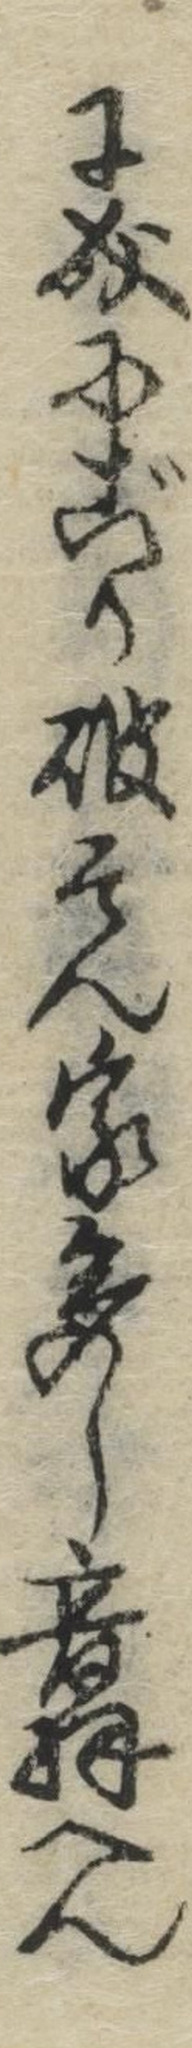に成にごり破そん家多し音羽へん
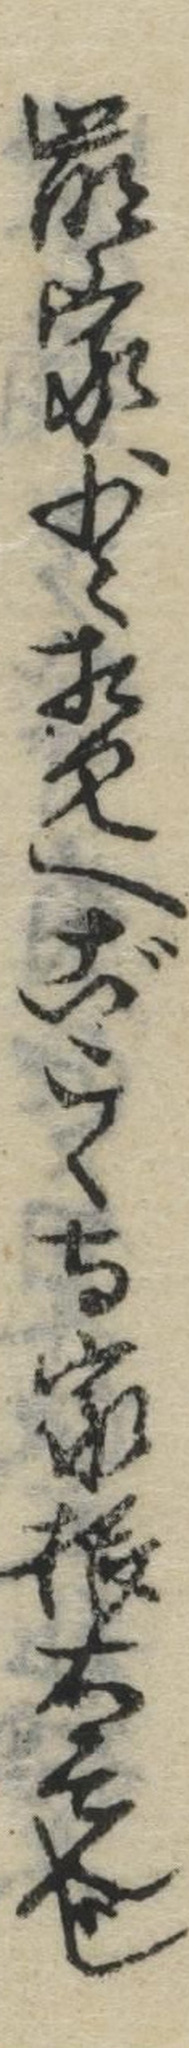崩家少〻相見へごこく寺家根大そんじ
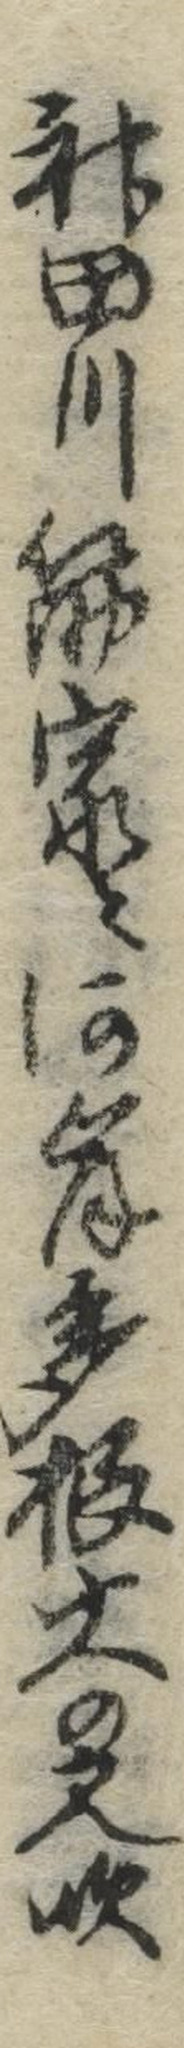神田川筋家ニ河岸多根火の見吹
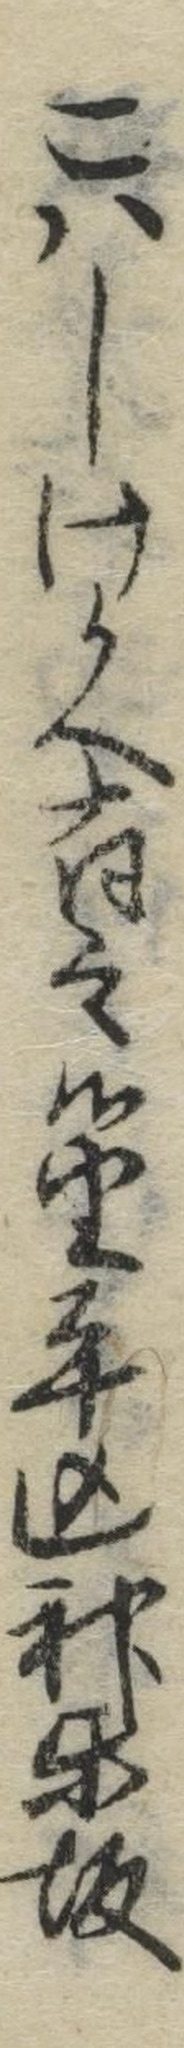こハしけかへ有之候由牛込神楽坂
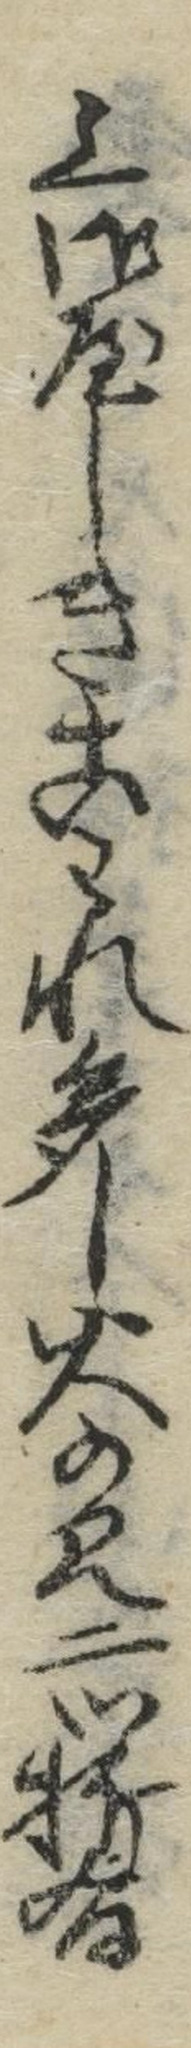上御屋しきこわれ多し火の見二ツ折有
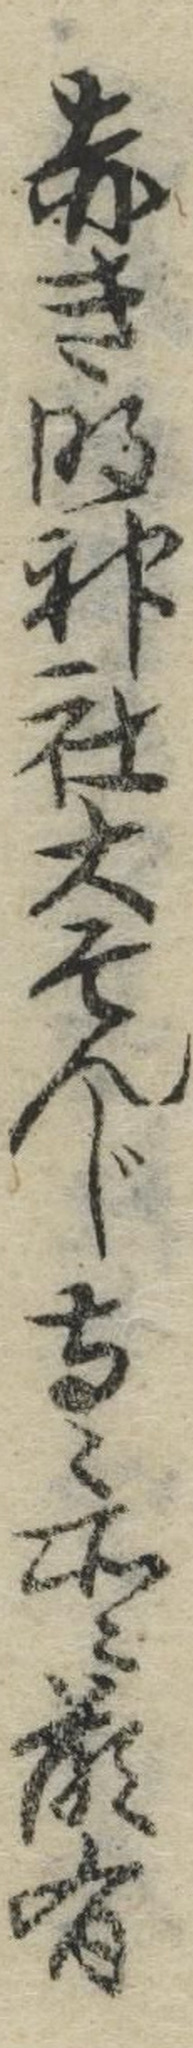赤き明神社大そんじ寺〻所〻崩有
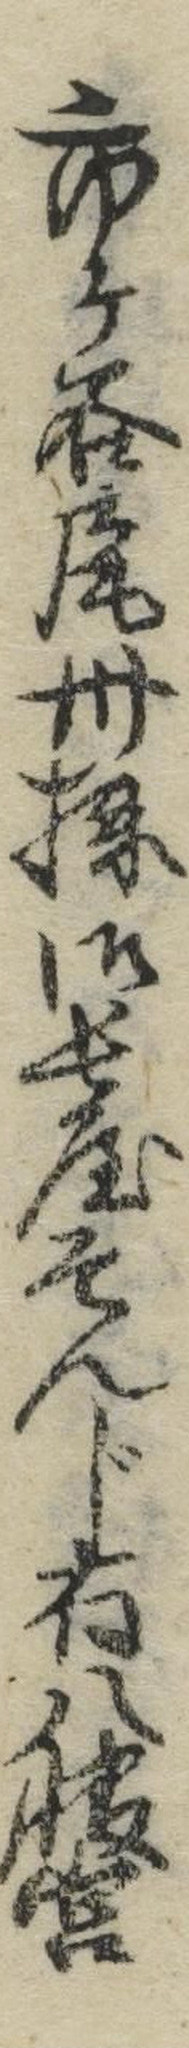市ケ谷尾州様御長屋そんじ有八幡宮
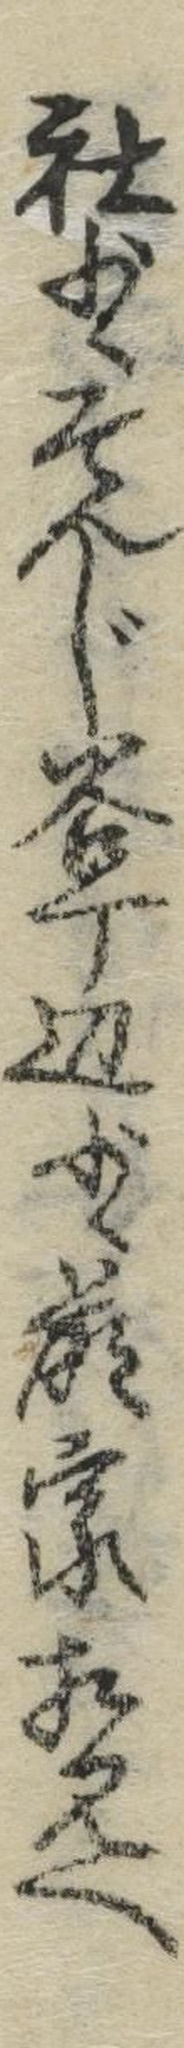社少〻そんじ谷丁辺少〻崩家相見へ
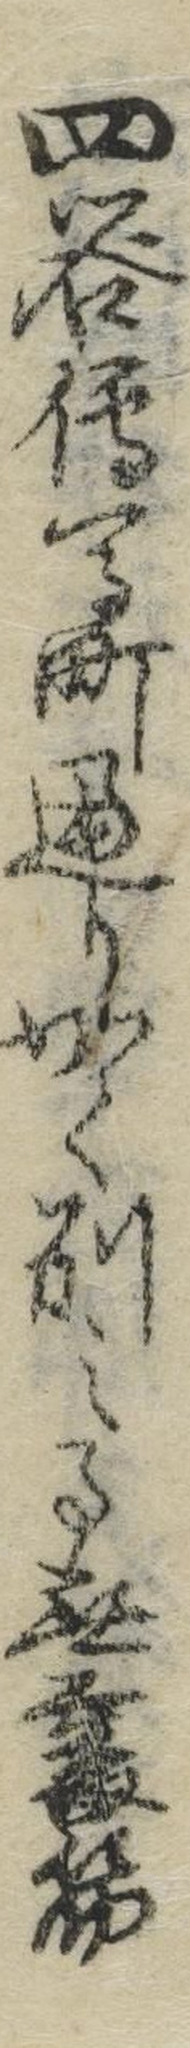四谷伝馬町通りかく別之事無番？筋
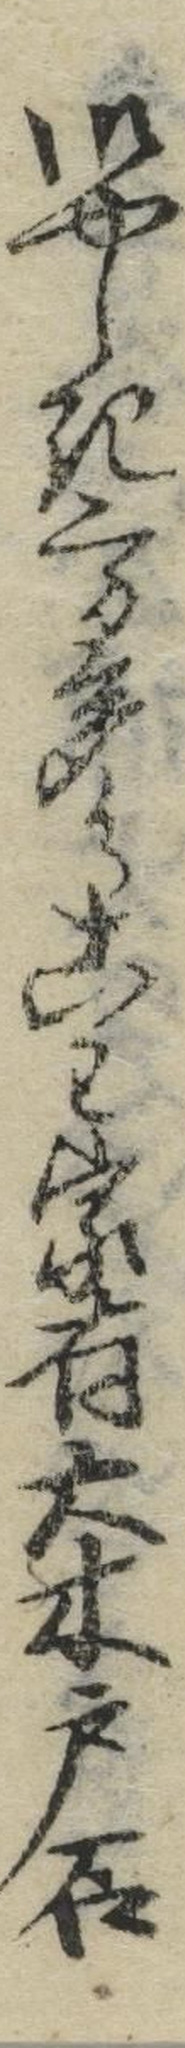御やしき方多くこわ家有大木戸石
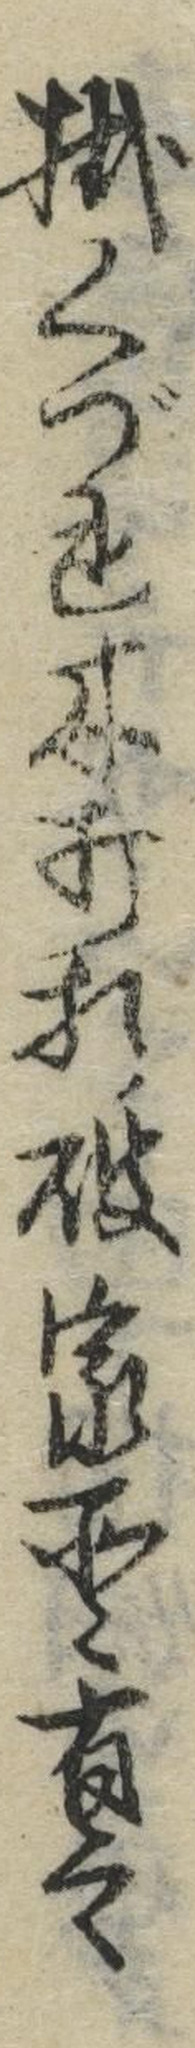掛くづれ木打折破家所〻有之
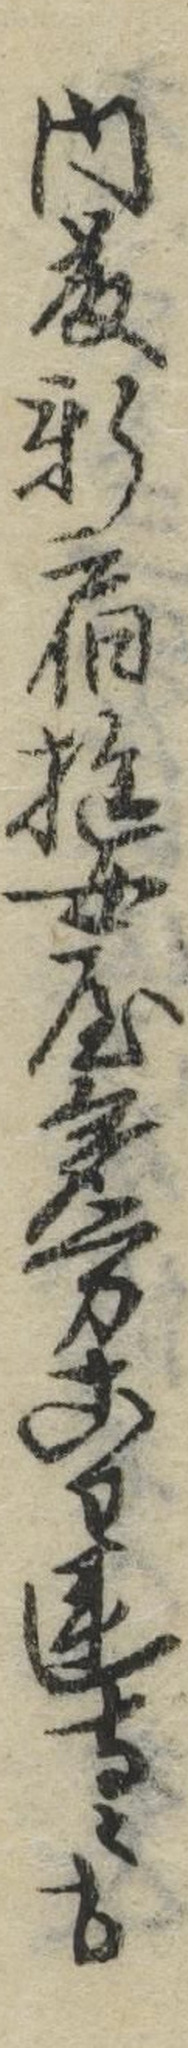内藤新宿遊女屋多方こわれ寺〻も
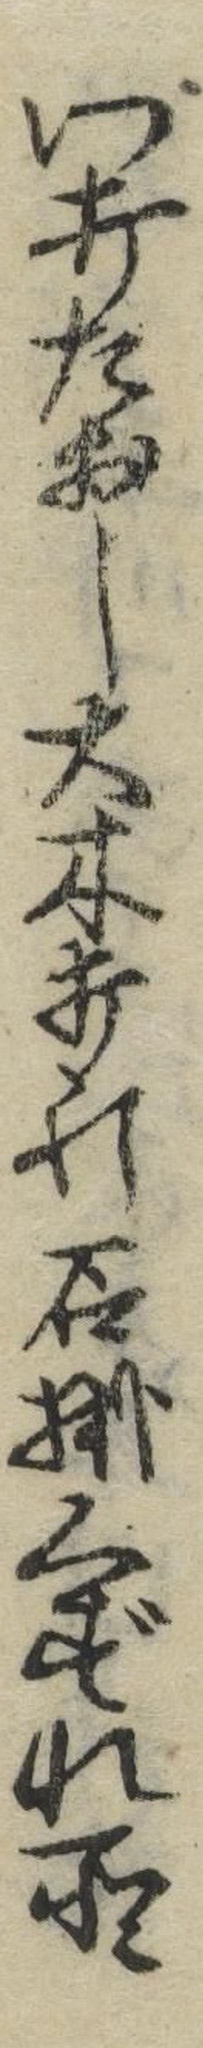門打たおし大木打折石掛くずれ所〻
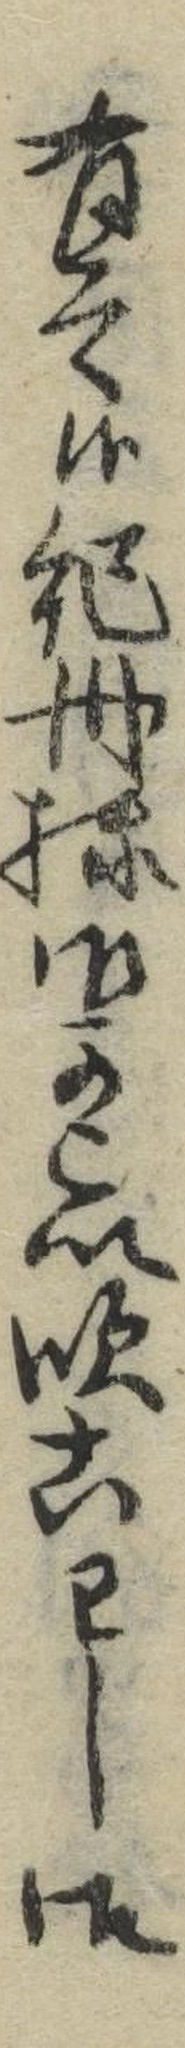有之候紀州様御かこい吹こわし御
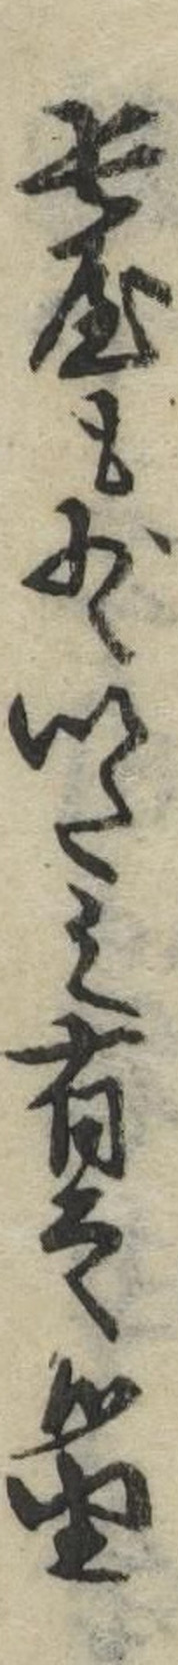長屋も少〻いたミ有之候由

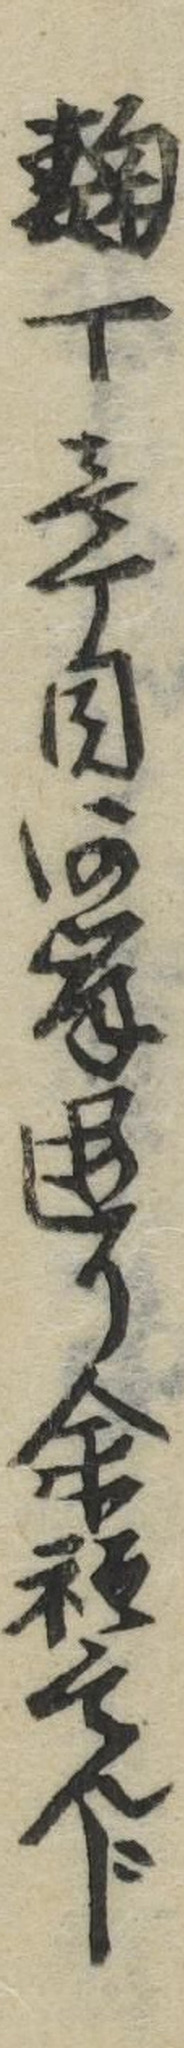麹丁壱丁目河岸通り余程そんじ
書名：安政三年辰八月廿五日夜　大江都御屋敷方寺社市中共　大嵐水入場所明細書之寫　并街道筋近郷聞書
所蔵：東京大学地震研究所図書室 Earthquake Research Institute Library, The University of Tokyo, JAPAN
